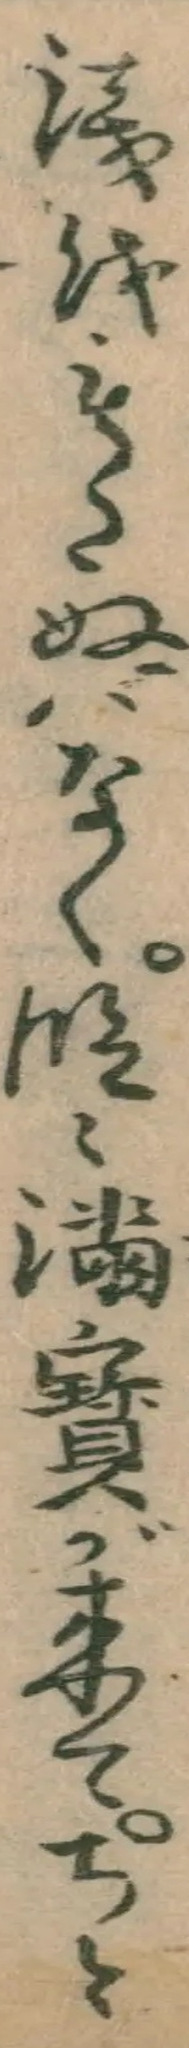銭をもたぬ、はなく。段々満宝が来て。ちと
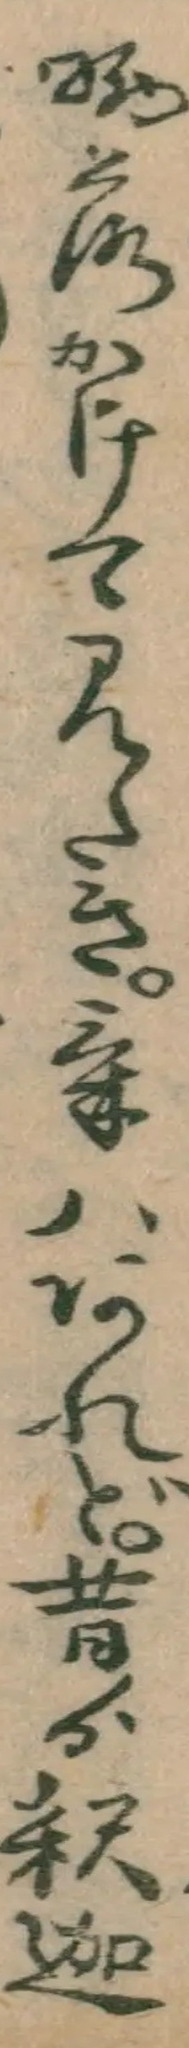晒落かけて見たき。気はあれど。昔より釈迦
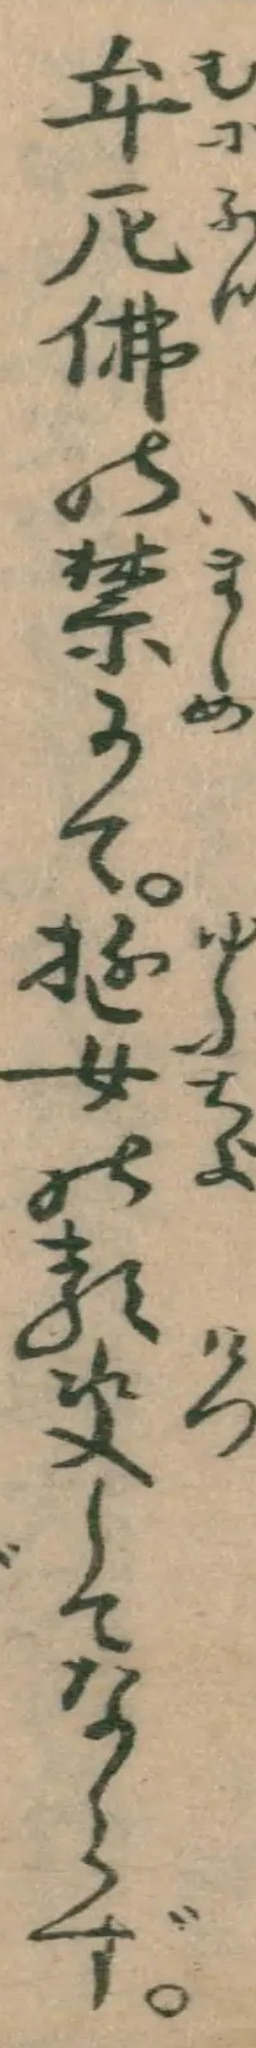牟尼仏の禁にて。遊女の類決してならず。
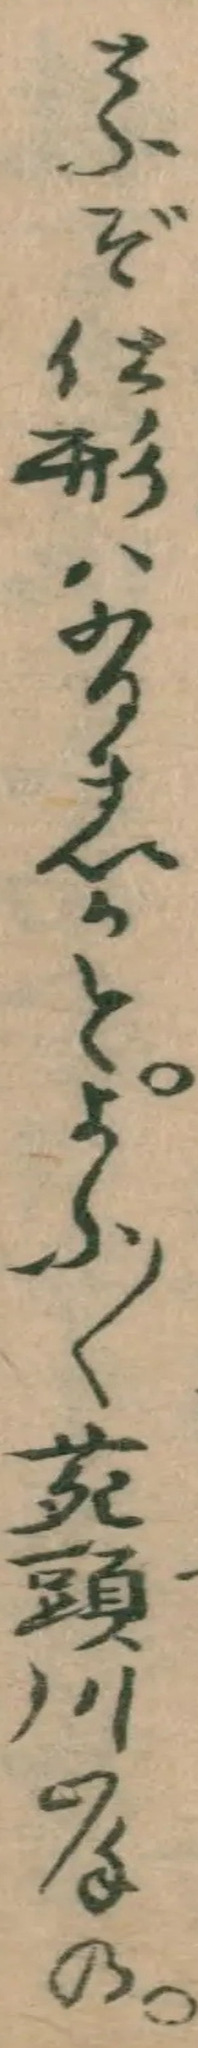なぞ仕形は有まいかと。よふ〳〵苑頭川岸の。
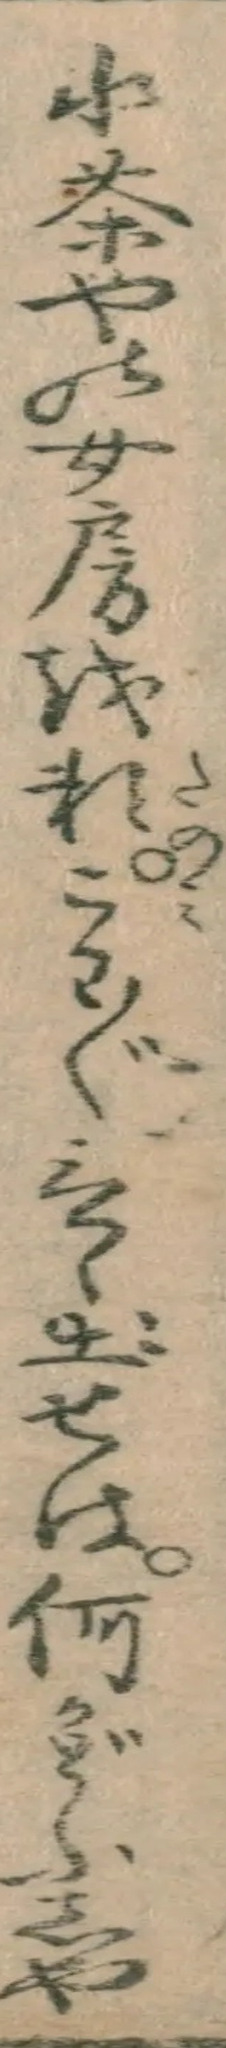水茶やの女房を頼。こわ〴〵言ゝ出せは。何かどふしや
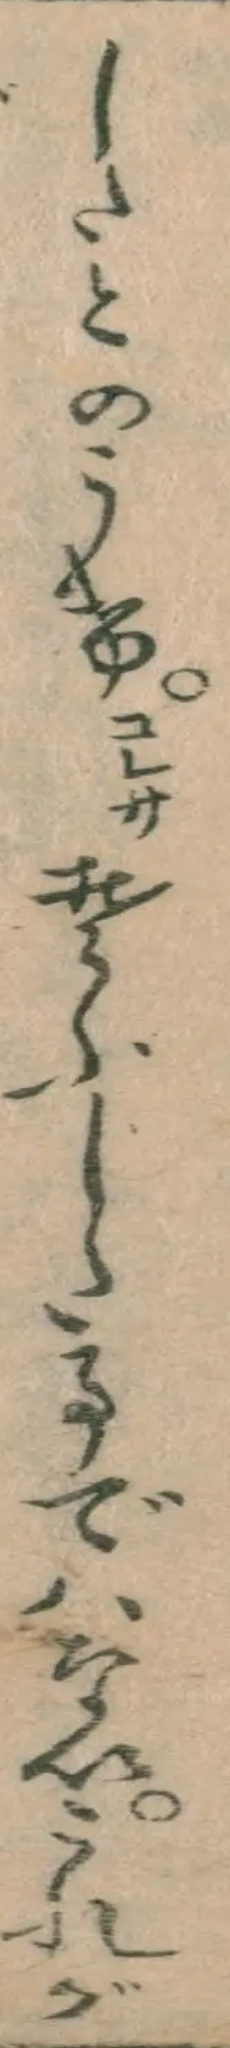したとのうけ。コレサそふした事ではない。これが
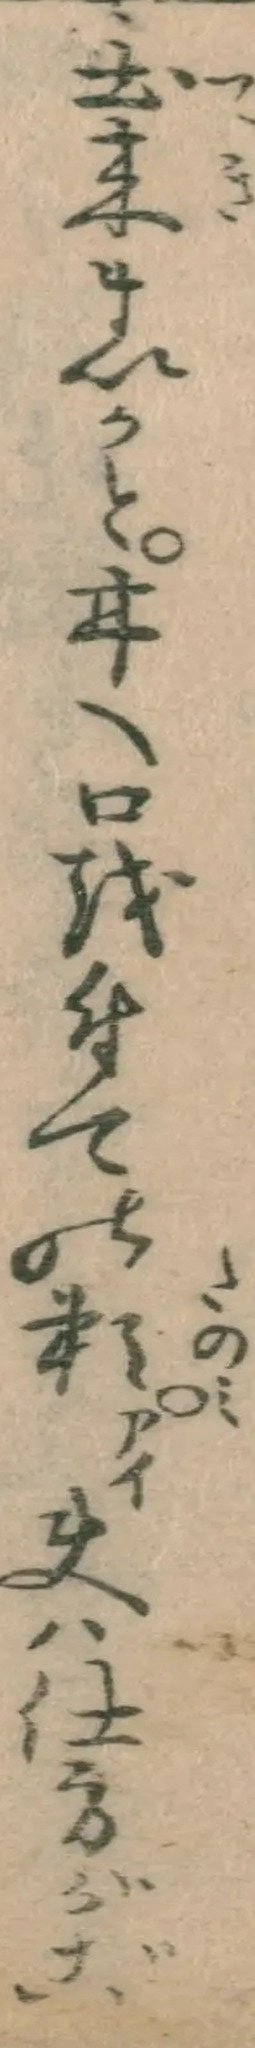出来まいかと。耳へ口を付ての頼。アイ夫は仕方がご
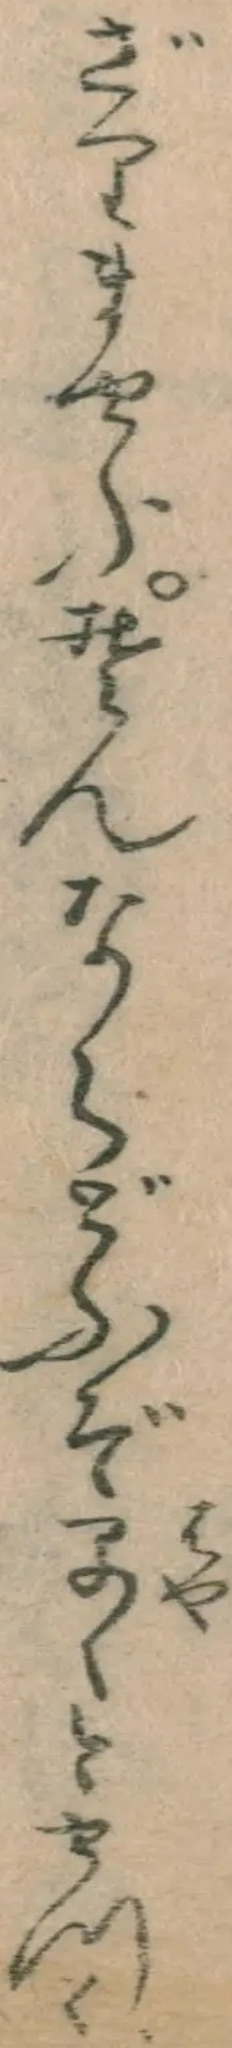ざりませふ。そんならどふぞ早くとせつく
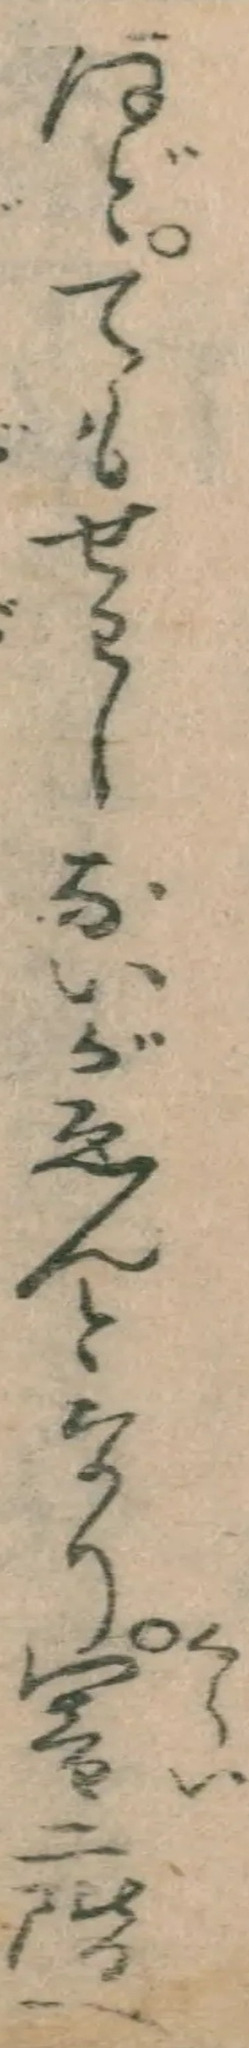ほど。てもせわしないがゑんとなり。闇二階へ
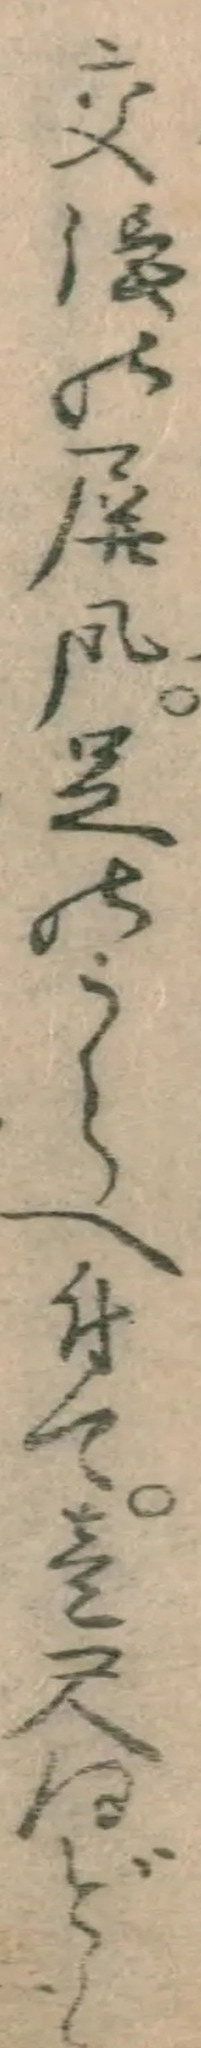交張の屏風。足のうらへ付て。壱尺ほども
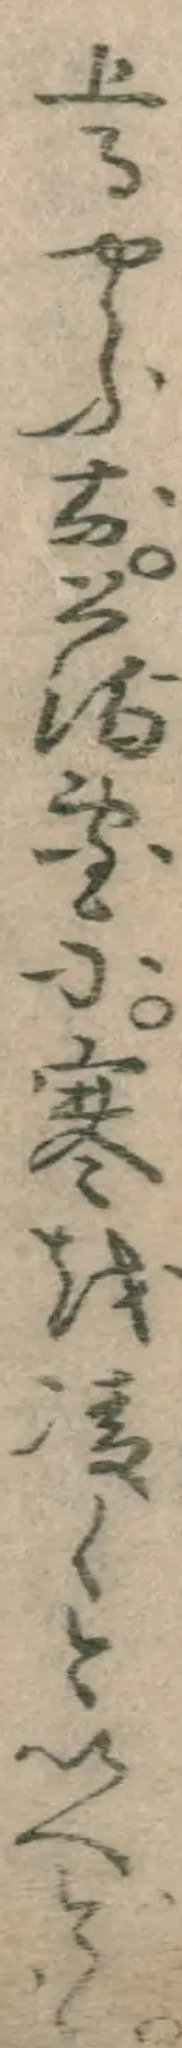上るやふな。蒲団に。寒を凌くといへども。
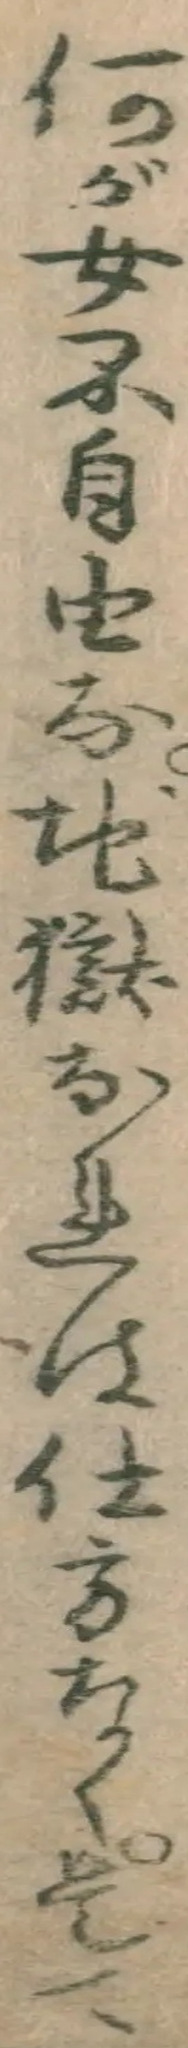何が女不自由な。地獄なれは仕方なく。是て

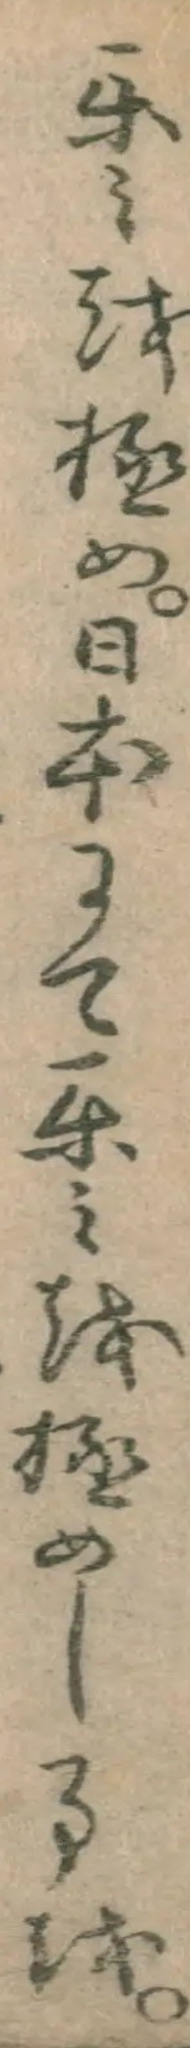楽みを極め。日本にて楽みを極めし事を。
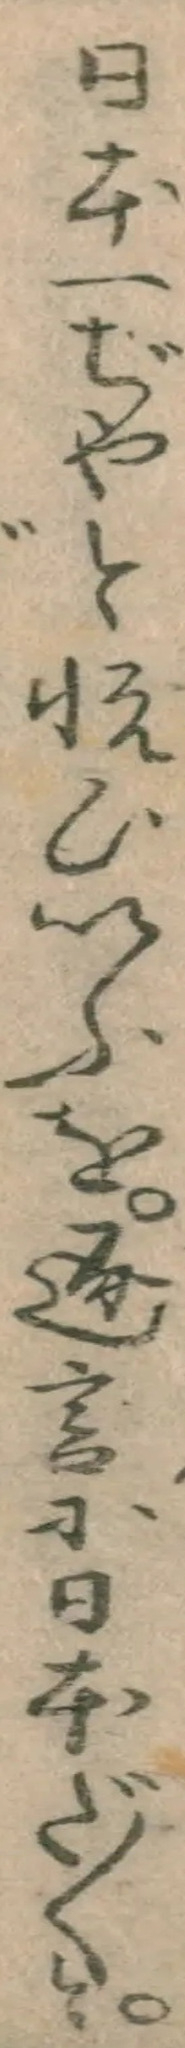日本一ぢやと悦ひいふを。通言に日本だ〳〵と。
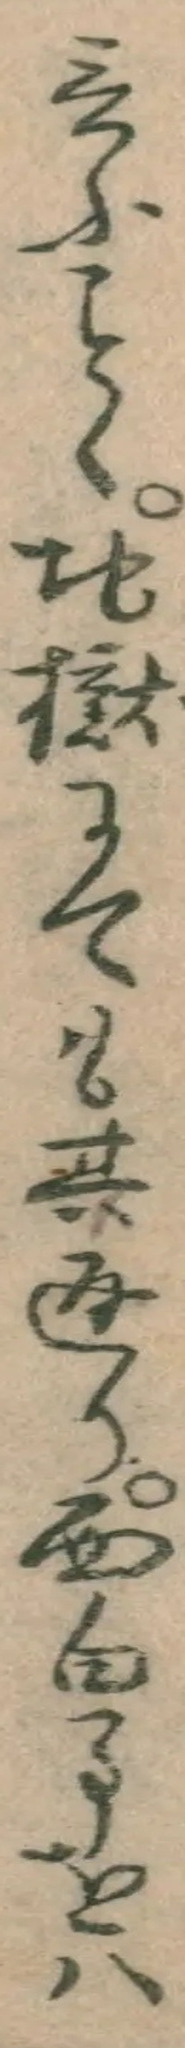言ふことく。地獄にても其通り。面白事をは
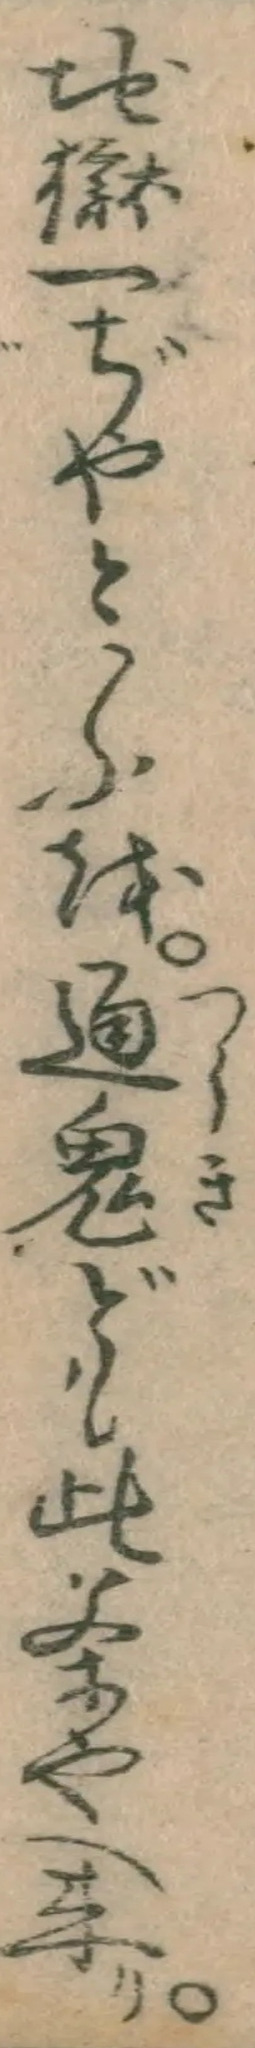地獄一ぢやといふを。通鬼ども此茶やへ来り。
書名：翻草盲目
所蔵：国立国会図書館 National Diet Library, JAPAN
